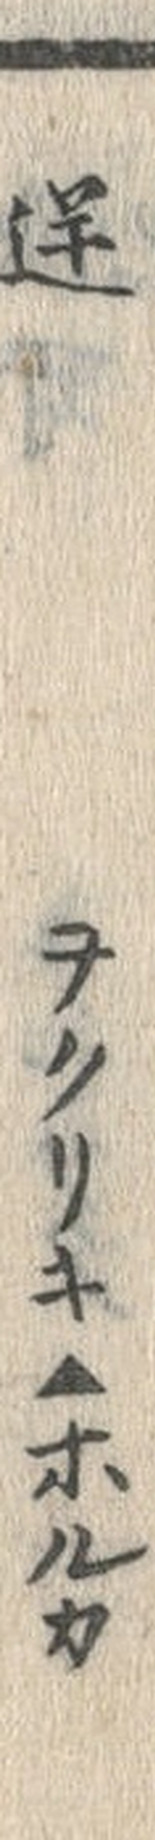逆ヲクリキ▲ホルカ

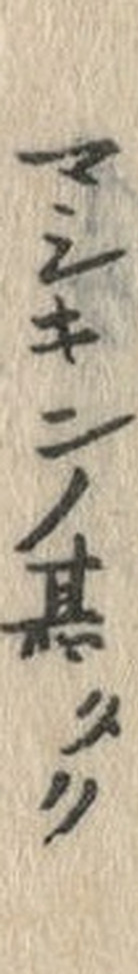愈マシキンノ甚タリ
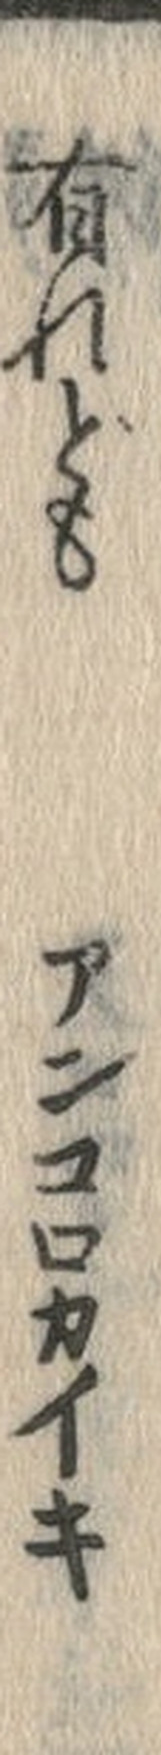有れどもアンコロカイキ
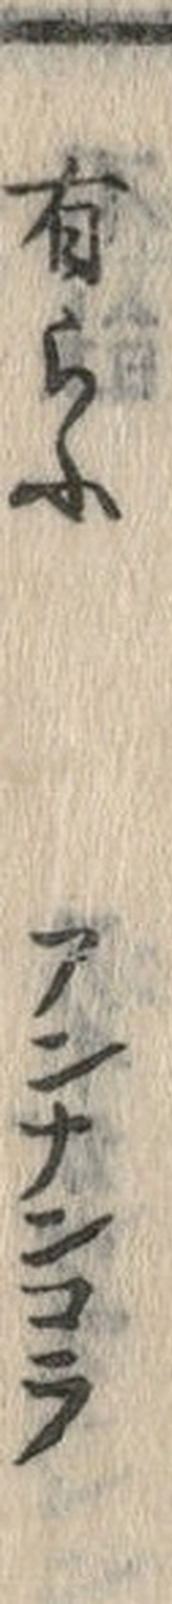有らふアンナンコラ
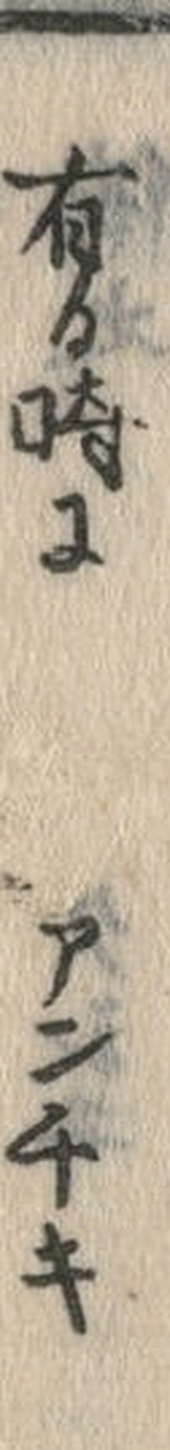有る時にアンチキ
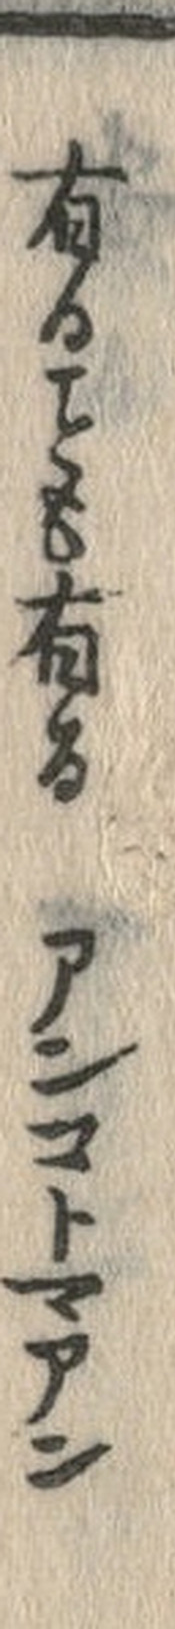有ることも有るアンコトマアン
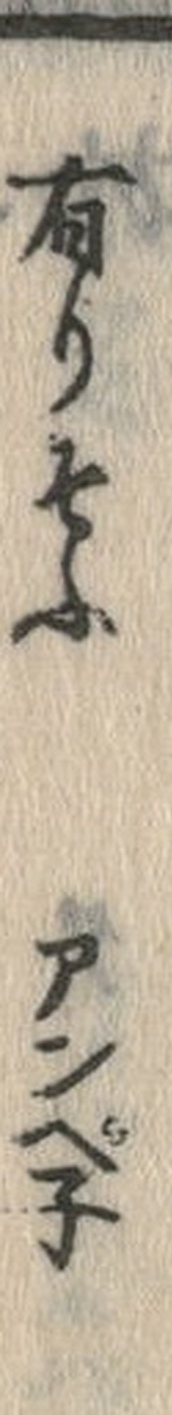有るそふアンベネ
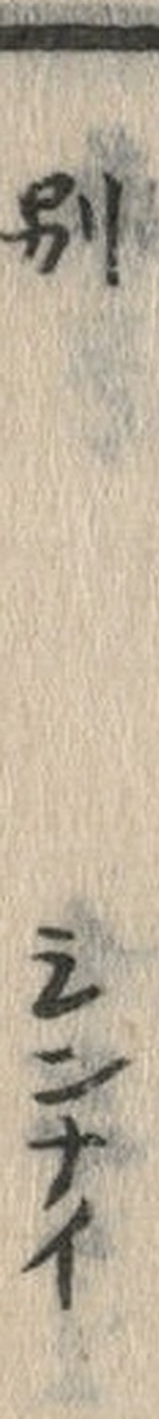別シンナイ
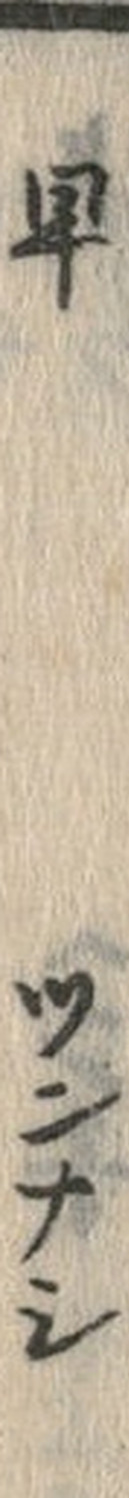早ツンナシ
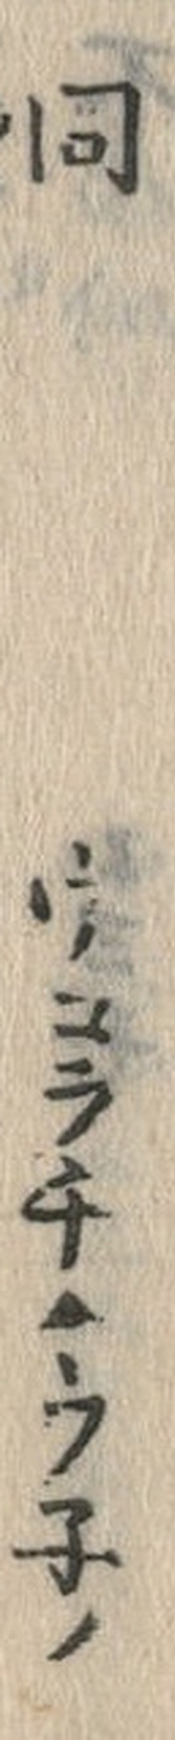同ウコラチ▲ウネノ

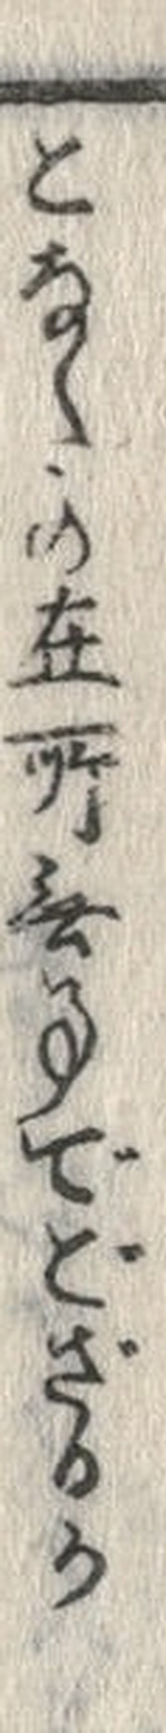となたの在所無事でござるか
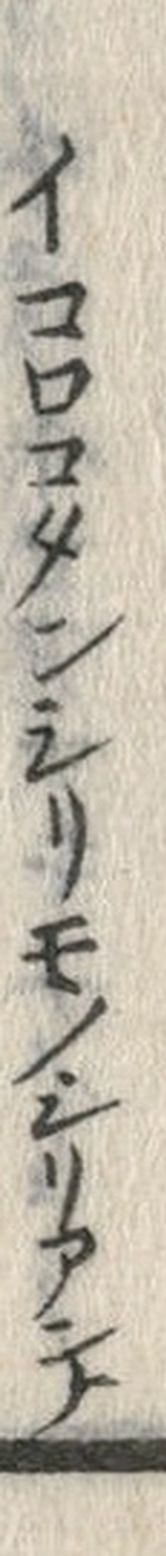イコロコタンシリモノシリアンナ
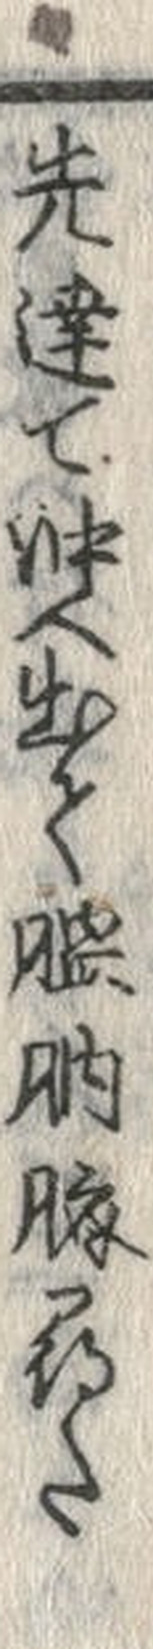先達て沖へ出て膃肭臍得た
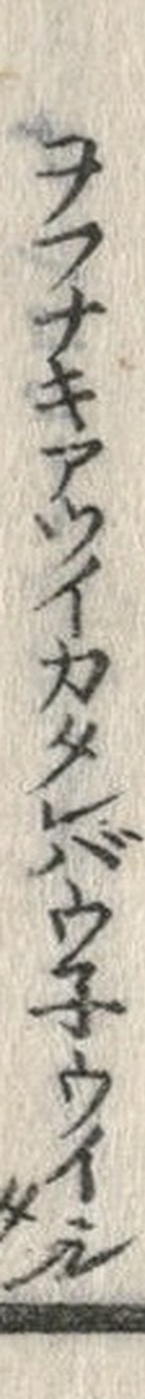ヲフナキアツイカタレバウネウイシタン
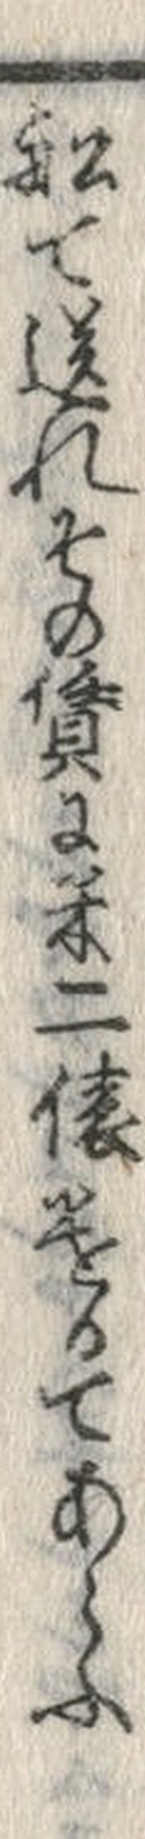船て送れその賃に米二俵遣るてあらふ
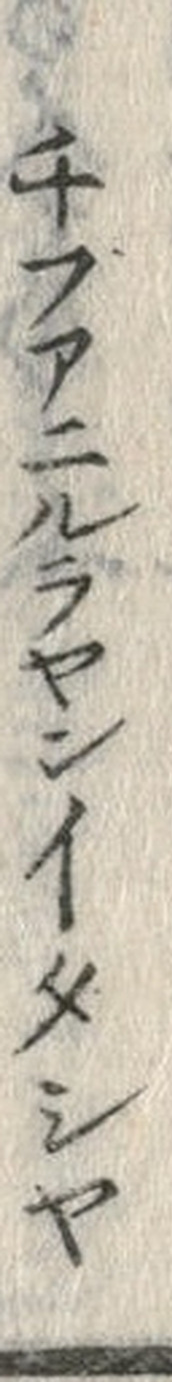チブアニルラヤンイタシヤ
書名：蝦夷方言藻汐草　坤巻
